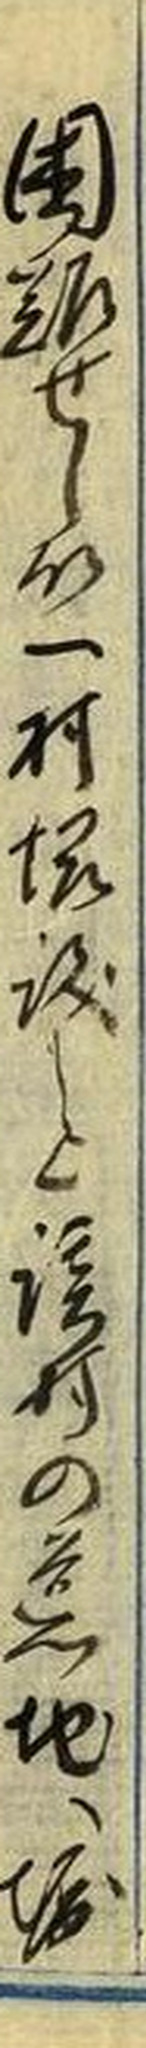困難せし故一村協議して該村の荒地へ堀
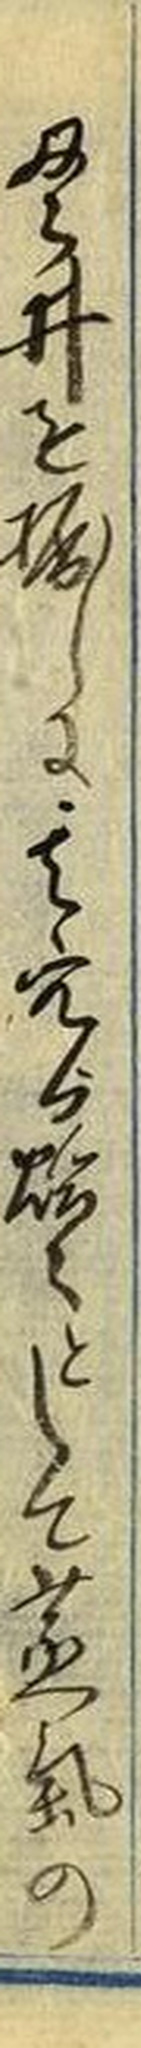貫井を掘しに其穴ゟ焔々として蒸気の
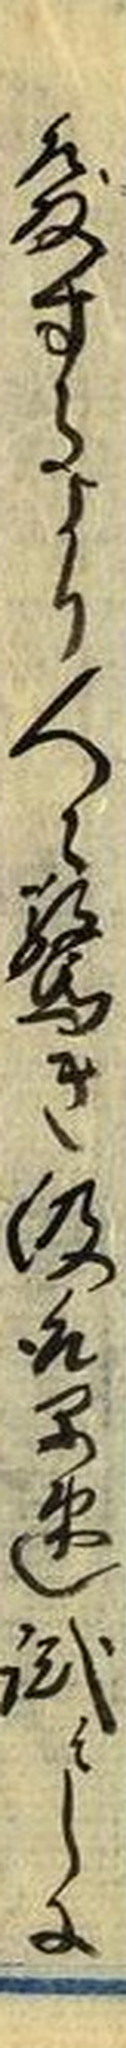発するより人々驚き汲取り早速試みしに
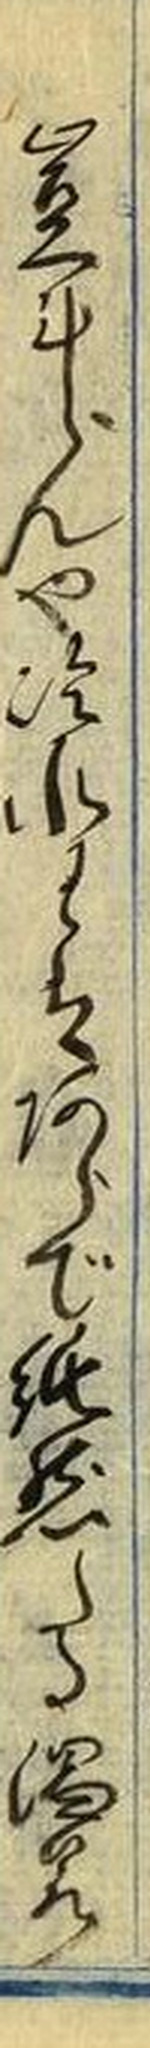豈計らんや冷水にはあらで純然たる温泉
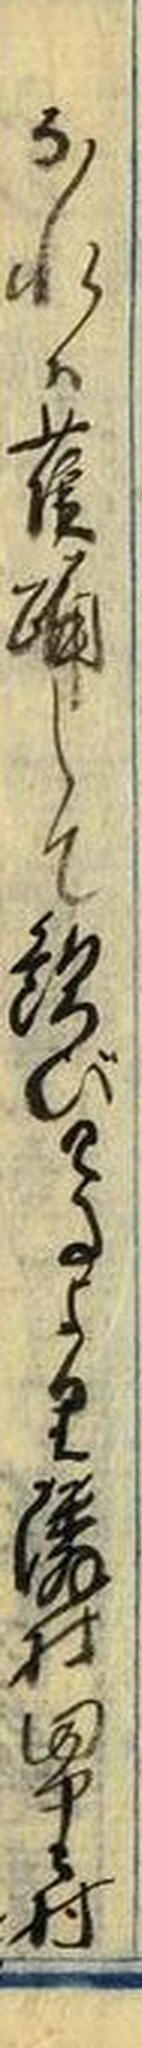なれは雀踊して歓びけるより隣村田中々村も
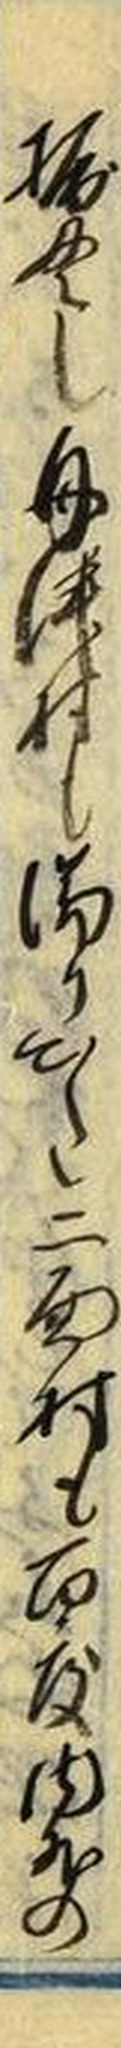掘貫し船津村も湯か出た二面村も百度内外の

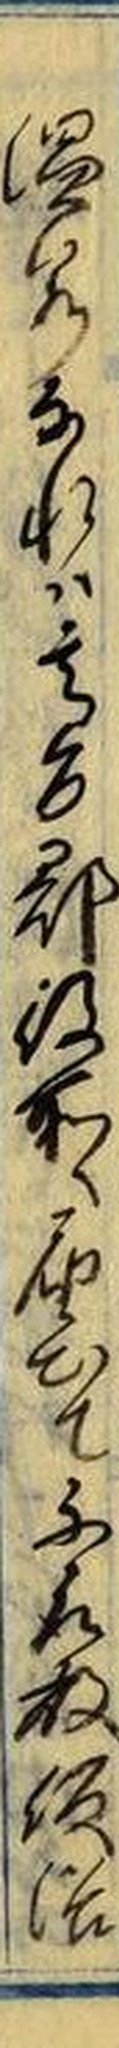温泉なれは其旨郡役所へ届出て不取敢仮浴
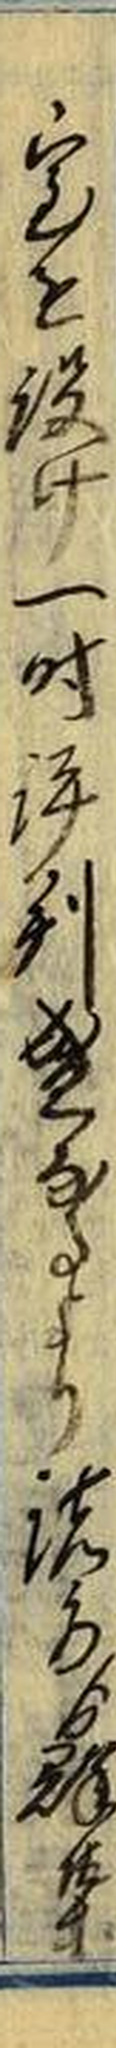室を設け一時評判盛なるより諸方ゟ群集
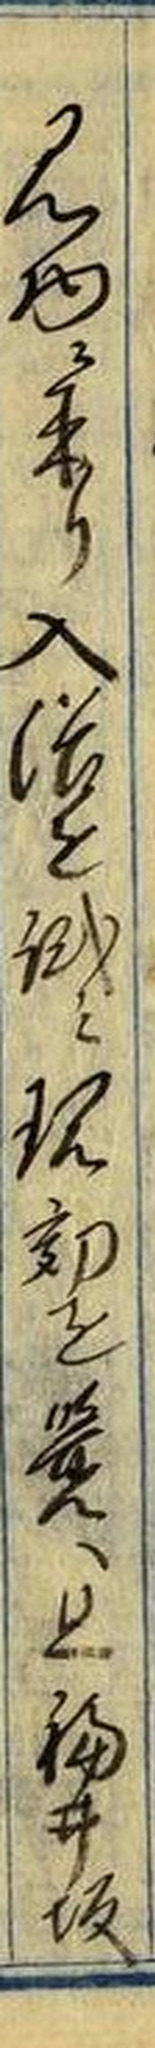見物に来り入浴を試み現効を覚へ且福井坂
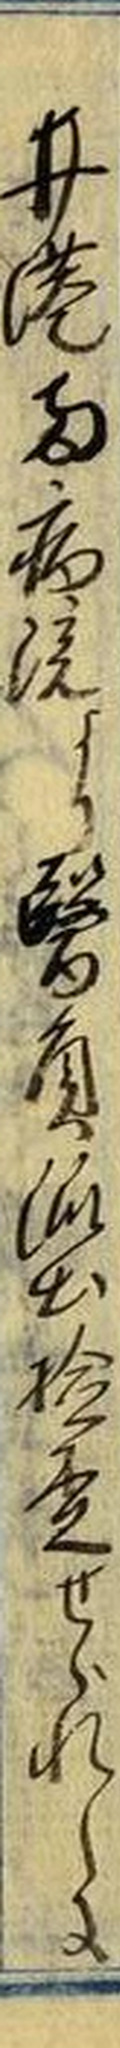井港両病院より医員派出検査せられしに
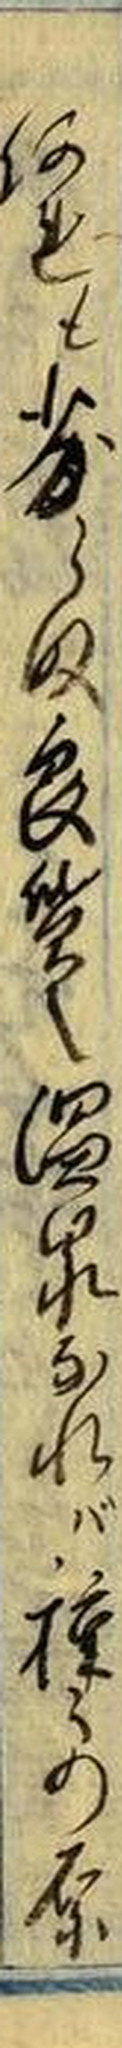何れも劣らぬ良質の温泉なれば種々の原
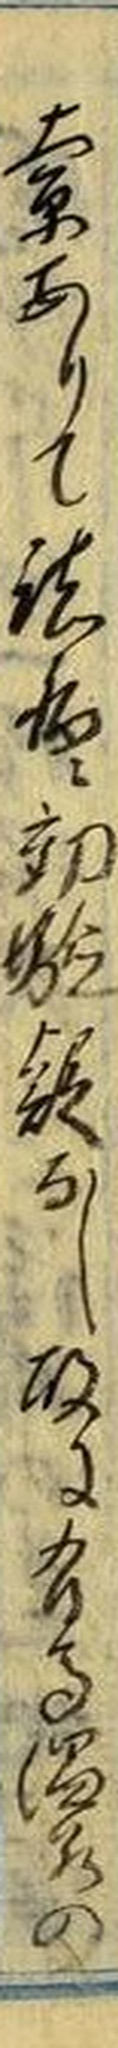索ありて諸病に効験疑なし故に有馬温泉の
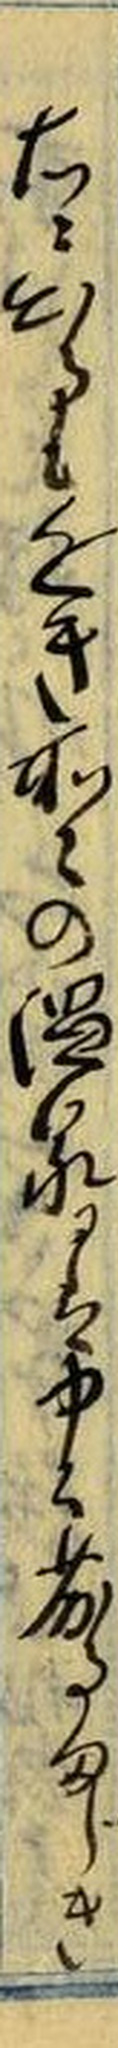右に出るも近き所々の温泉には中々劣るまじき
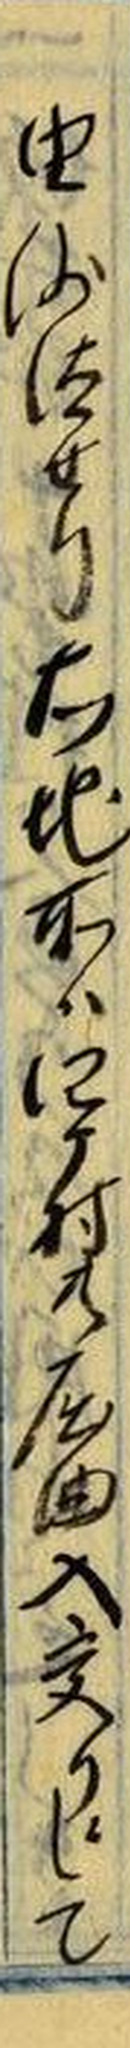由沙汰せり右地所は四ケ村共屈曲入交りにして
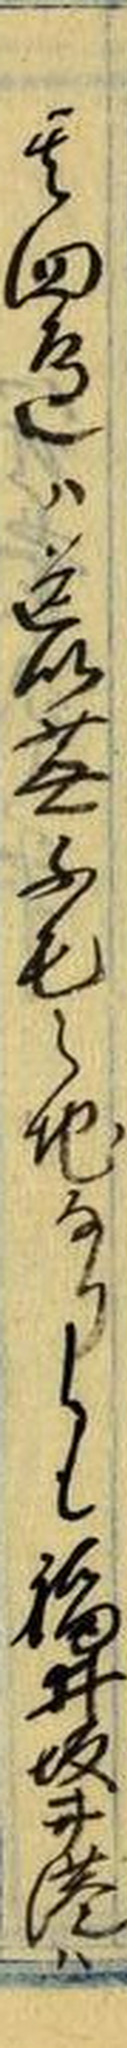其回辺は荒蕪不毛之地なりしも福井坂井港は
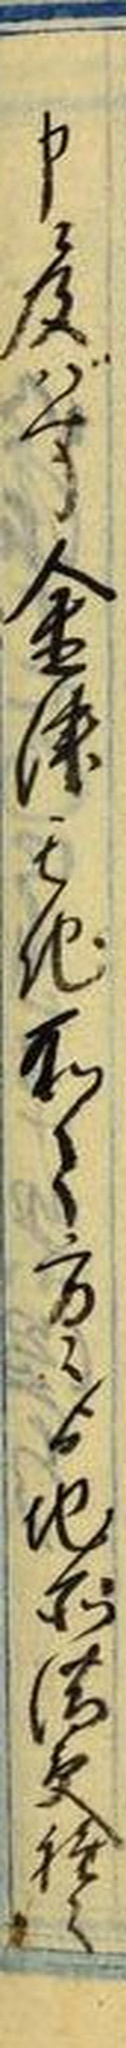申に及ばず金津其地所之方々ゟ地所借受種々
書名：温古集 五巻
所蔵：福井県文書館 Fukui Prefectural Archives
